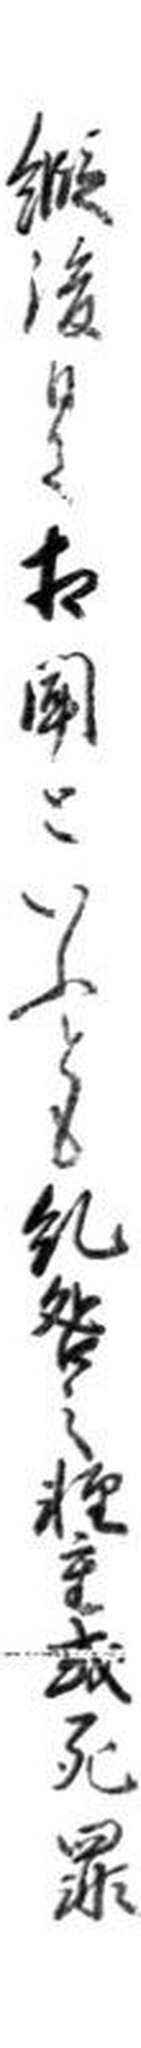縦後日に相聞といふとも糺咎之軽重或死罪
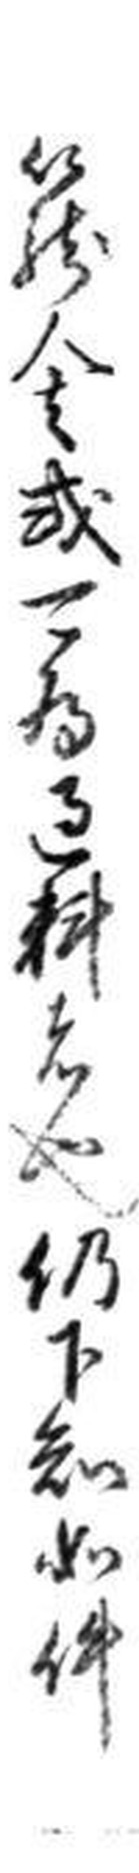籠舎或可為過料者也仍下知如件
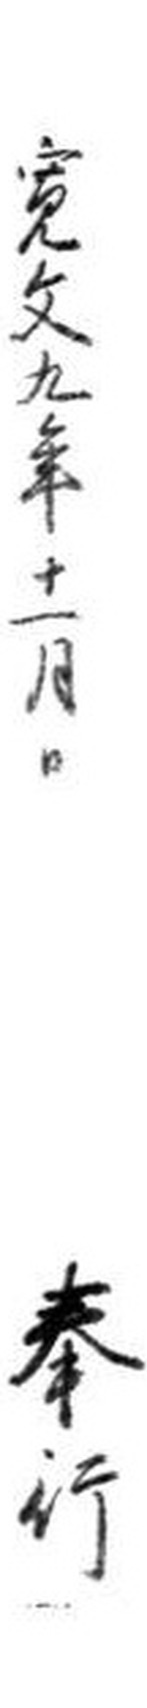寛文九年十一月日奉行
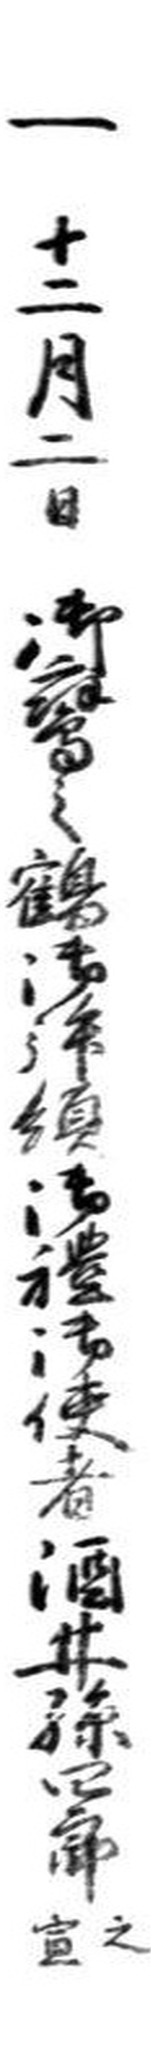一十二月二日御鷹之鶴御拝領御礼御使者酒井孫四郎之宣
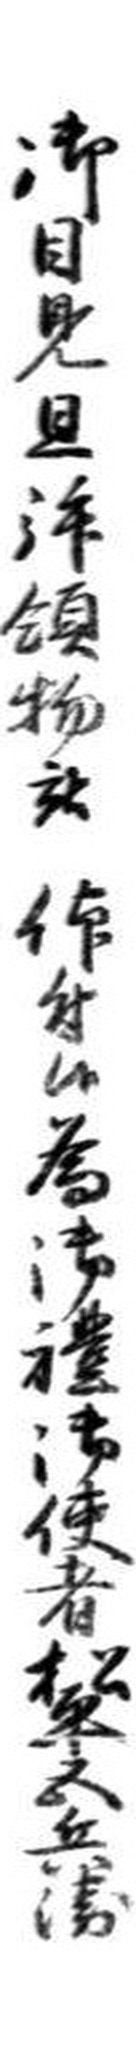御目見且拝領物被仰付候為御礼御使者松平五兵衛
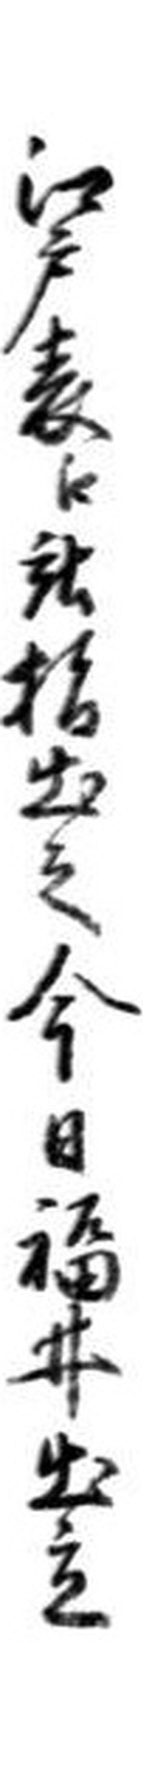江戸表江被指出之今日福井出立
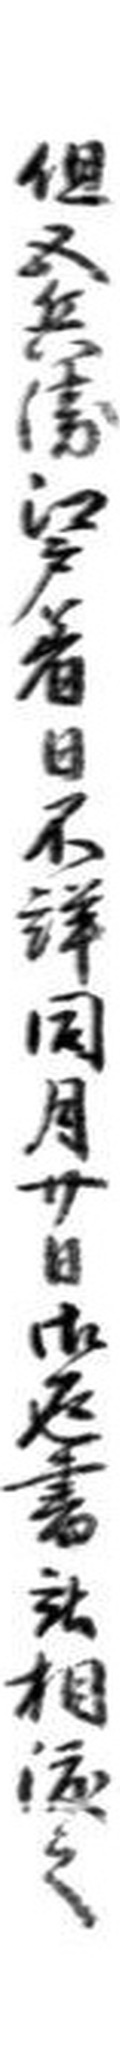但五兵衛江戸着日不詳同月廿日御返書被相渡之
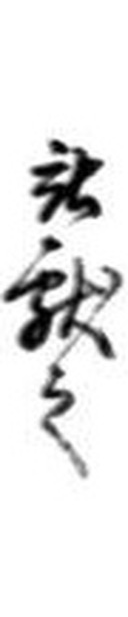被献之
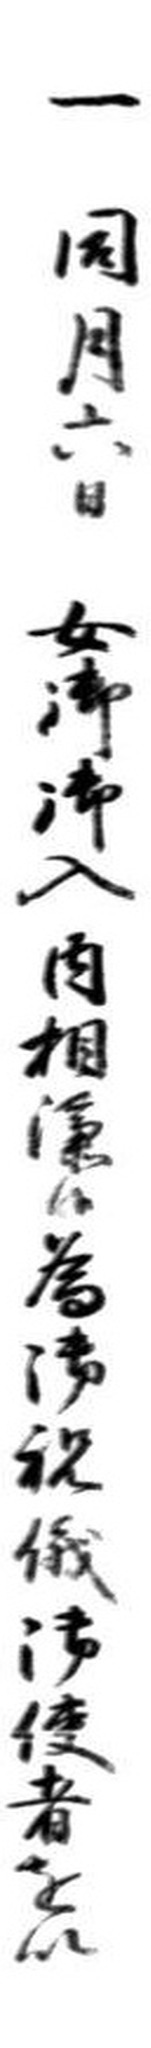一同月六日女御御入内相済候為御祝儀御使者を以
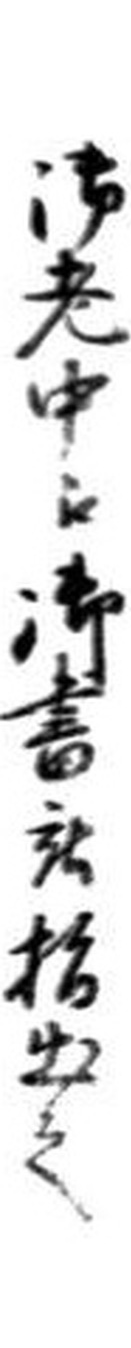御老中江御書被指出之
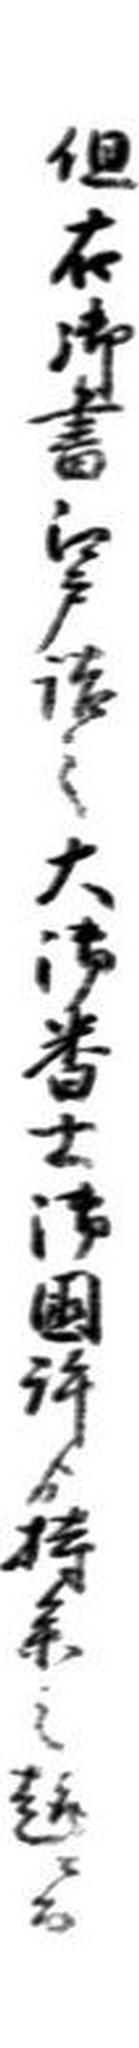但右御書江戸詰之大御番士御国許ゟ持参之趣ニ而
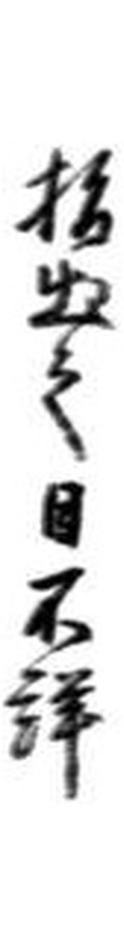指出之日不詳
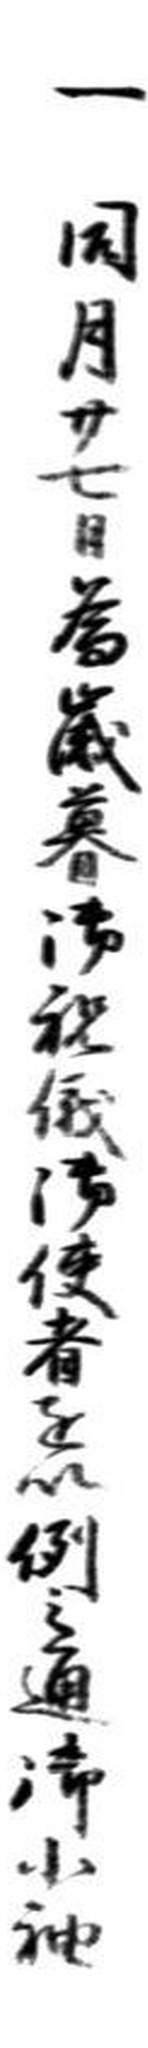一同月廿七日為歳暮御祝儀御使者を以例之通御小袖
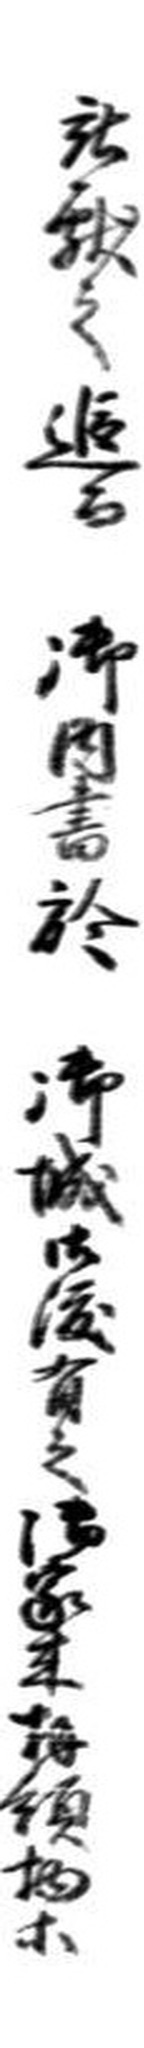被献之追而御内書於御城御渡有之御家来拝領物等

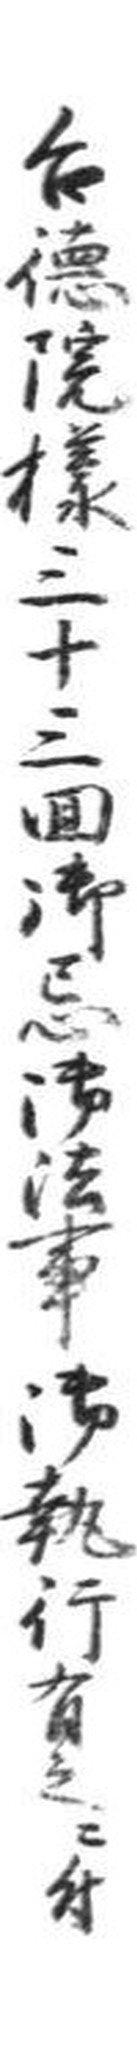台徳院様三十三回御忌御法事御執行有之ニ付
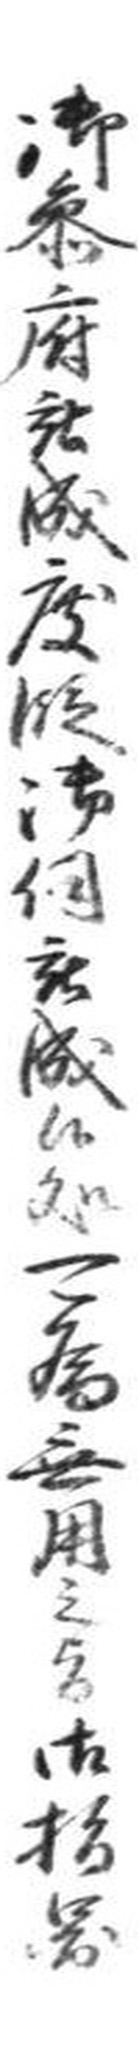御参府被成度段御伺被成候処可為無用之旨御指図
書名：家譜 七 光通公 従寛文四年到同九年
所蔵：福井県文書館 Fukui Prefectural Archives
